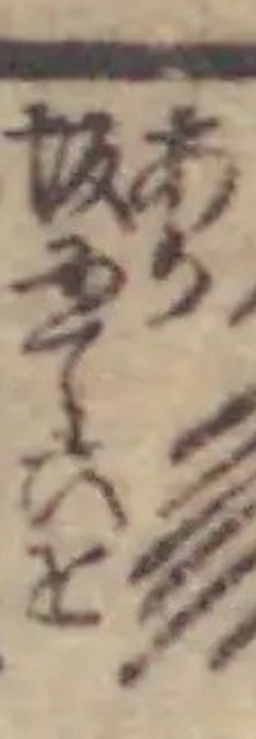坂にて六を
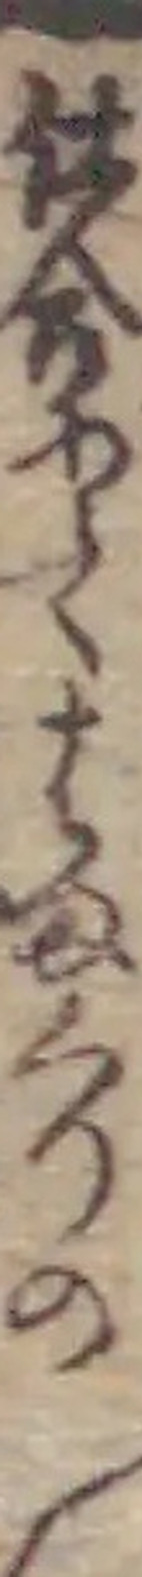仕合にてはまくりの
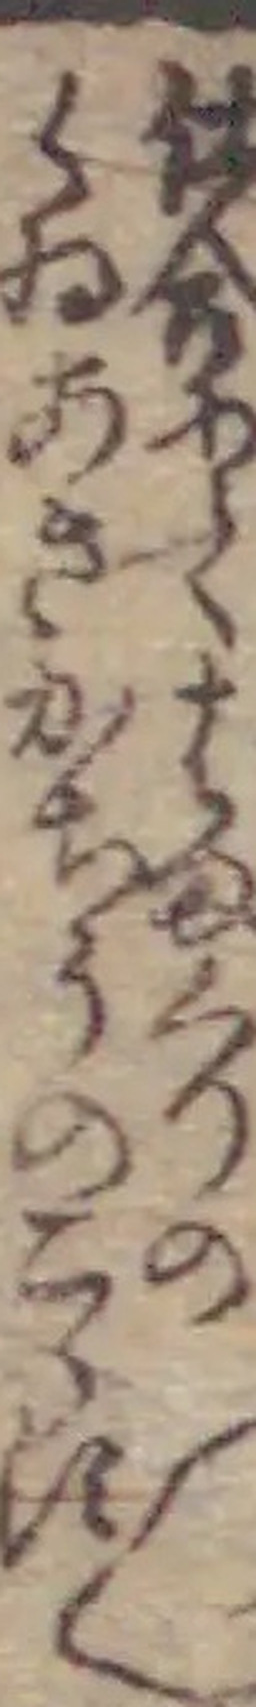くゐあきかちうのこらす
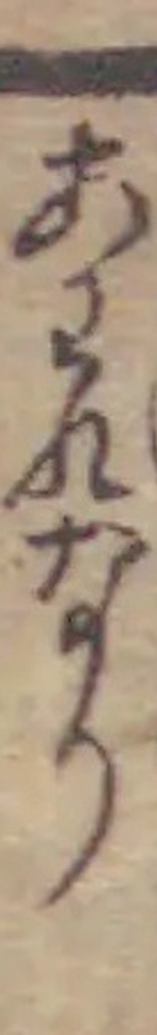あわれなり
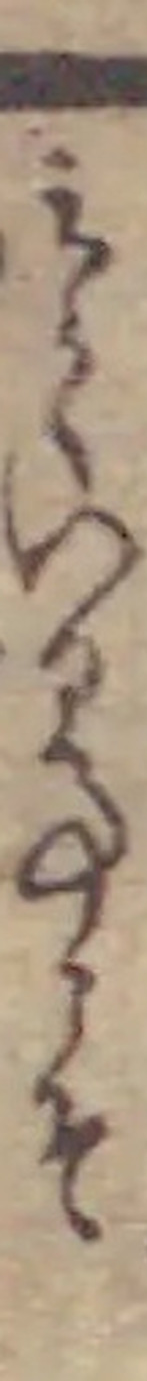みている事こそ
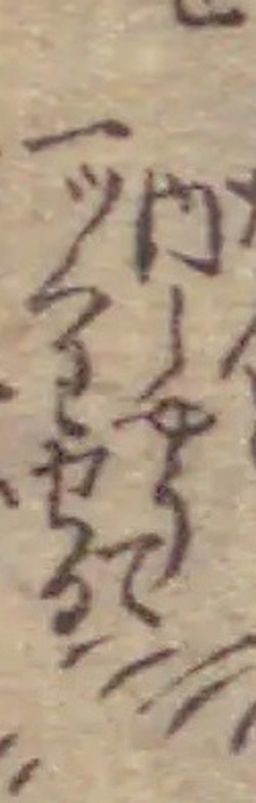一ツくわせる
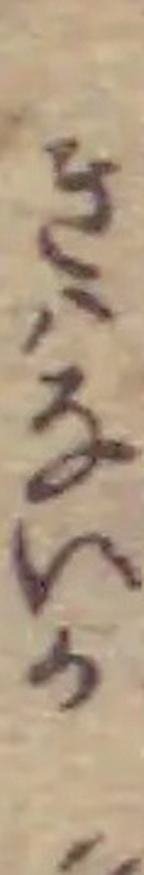きはないか

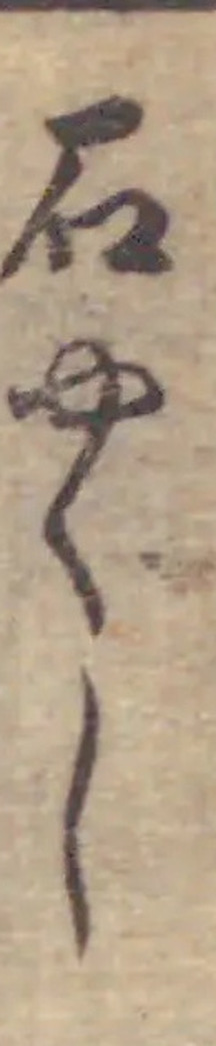石やくし
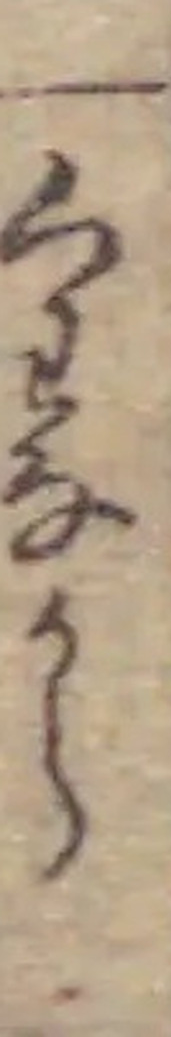くわなから
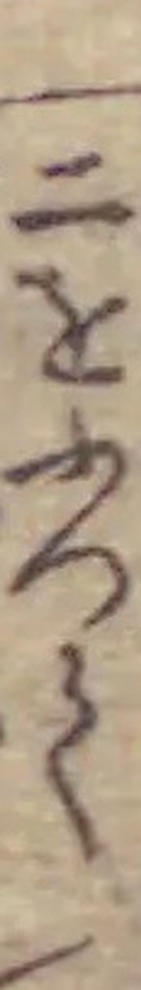二をふつて
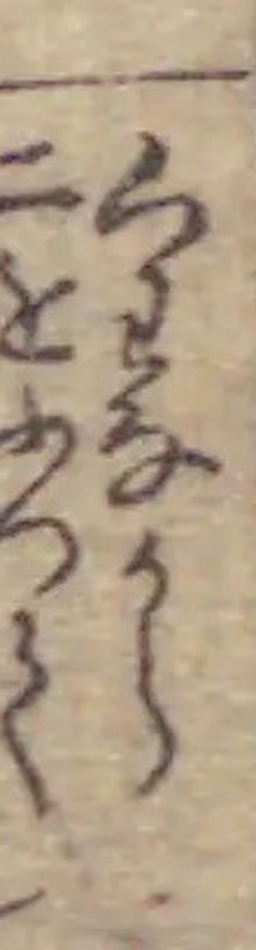二をふつて
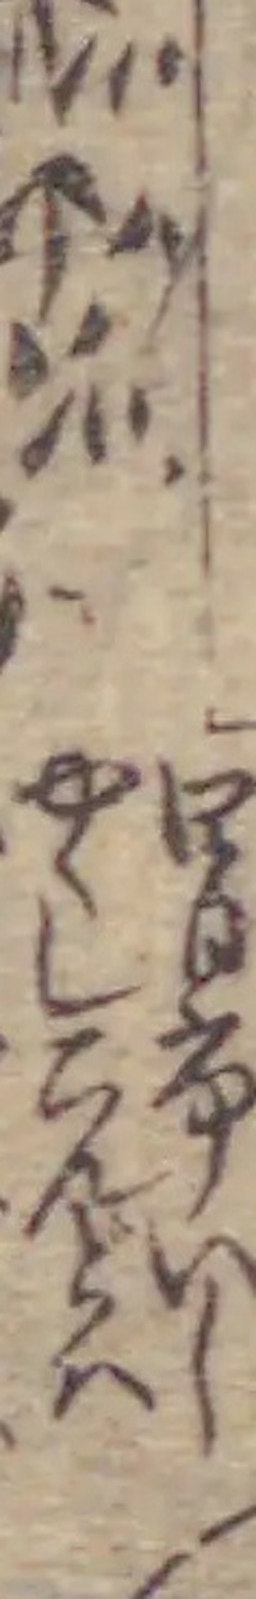やくしこんどは
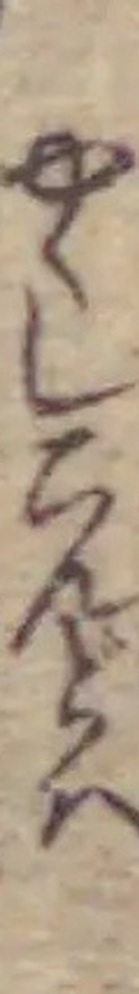やくしこんどは
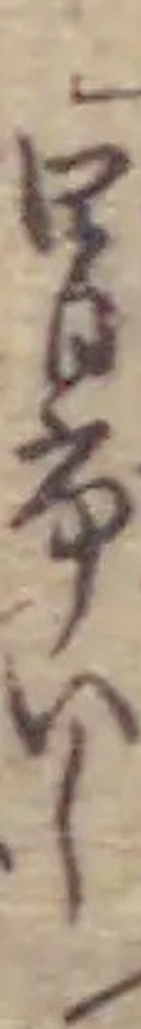四日市いし
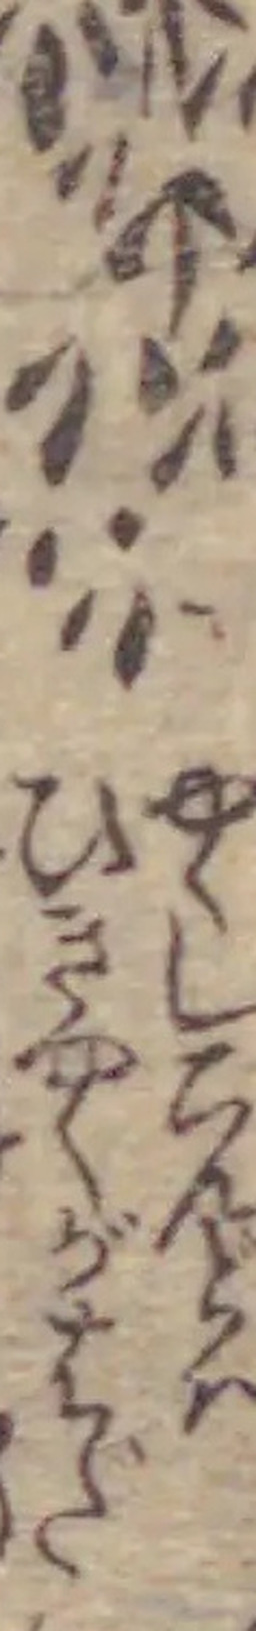ひきやくがはだ
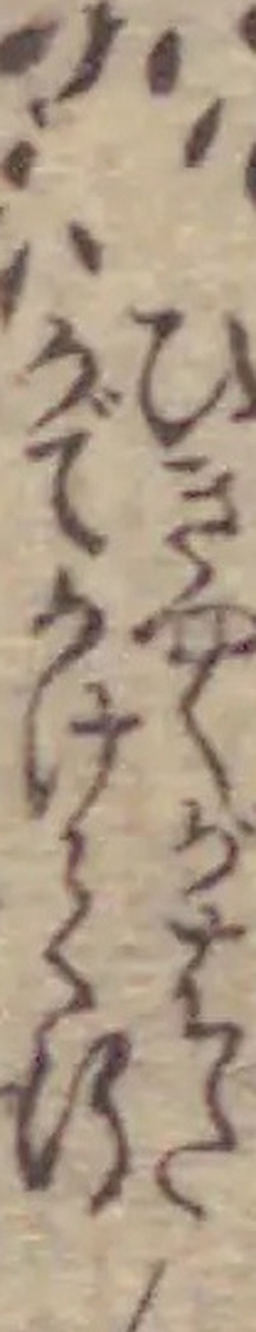かでかけて行
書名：道笑双六
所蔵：国立国会図書館 National Diet Library, JAPAN
